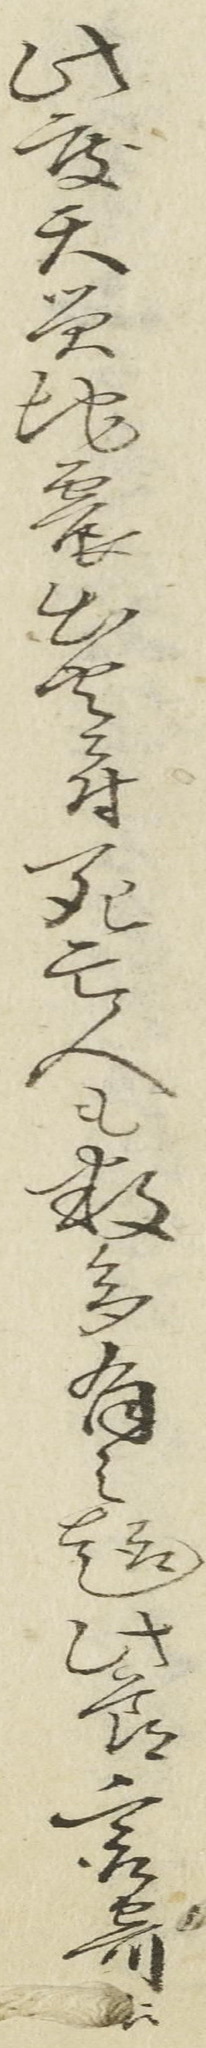此度天災地震出火二付死亡人も数多有之趣此節最寄
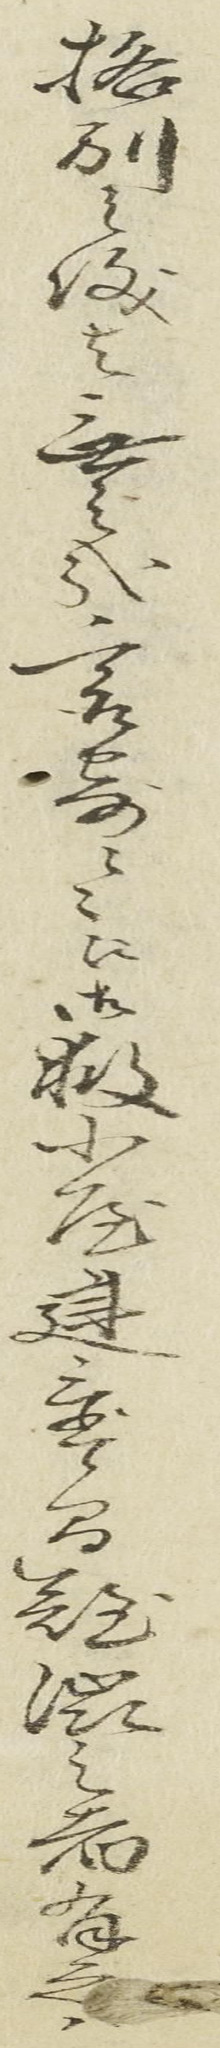格別之儀は無之哉最寄々々え御救小屋建置候間難渋之者有之ハ
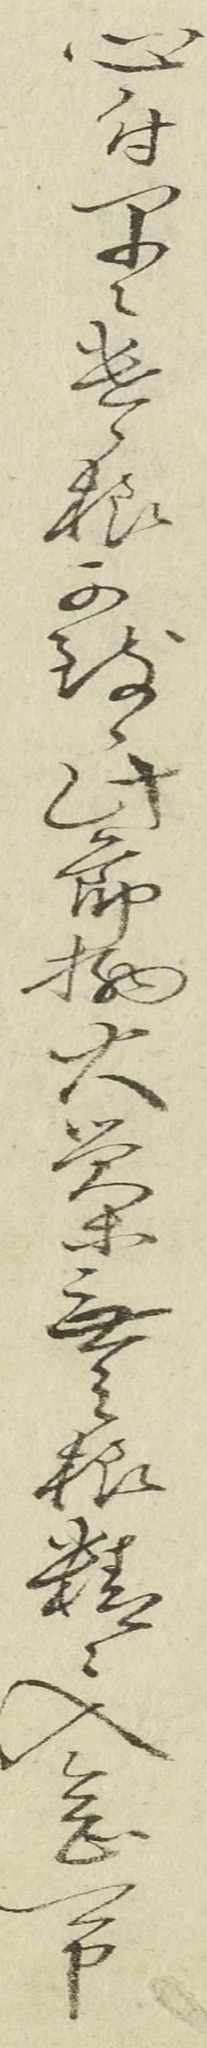心付早々遣候様可致候此節柄火災等無之様精々入念可申
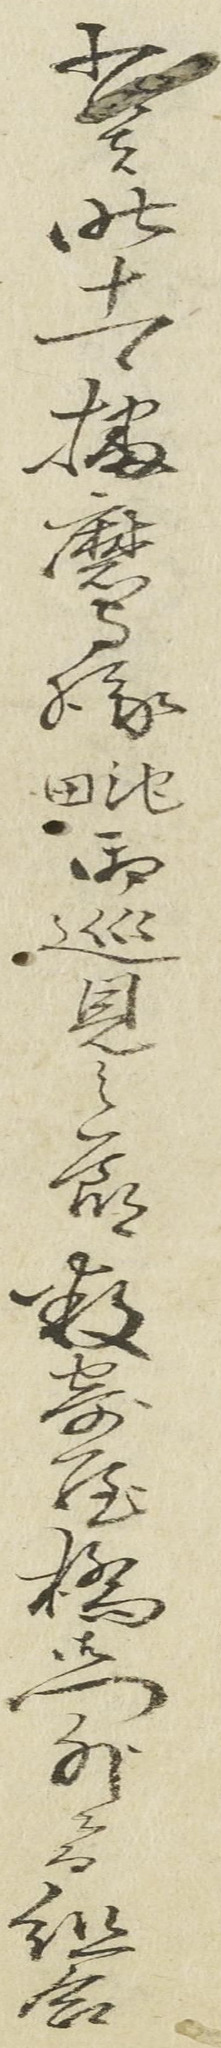右は昨十一日播磨守様池田御巡見之節数寄屋橋御門外二而組合
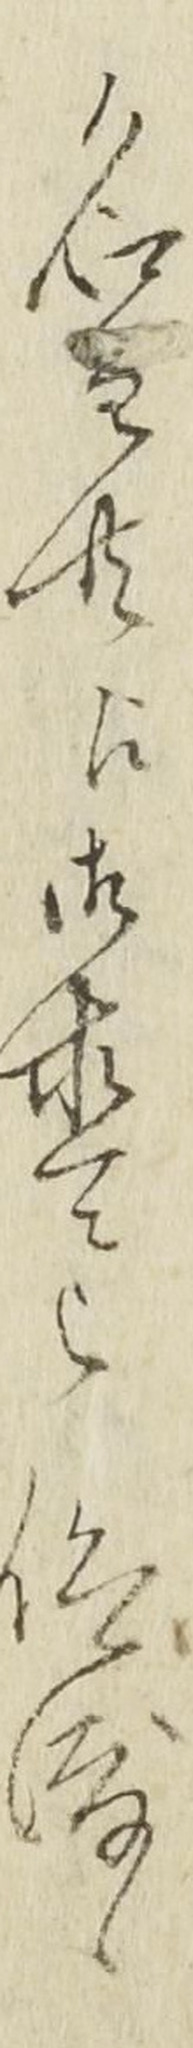名主共え御直二被仰渡候
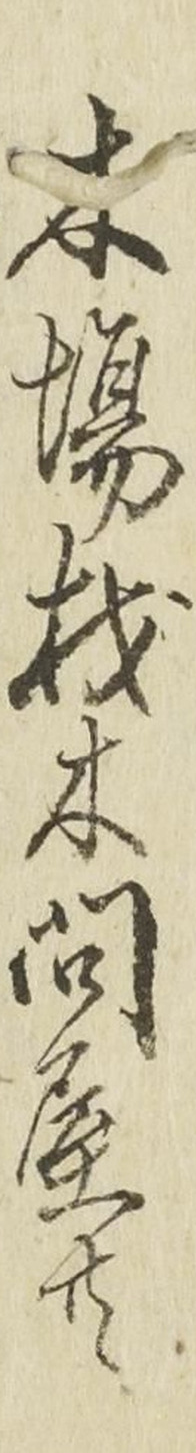木場材木問屋共
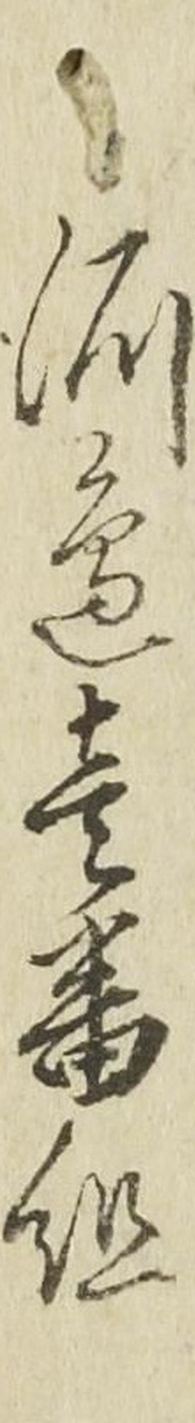河辺壱番組
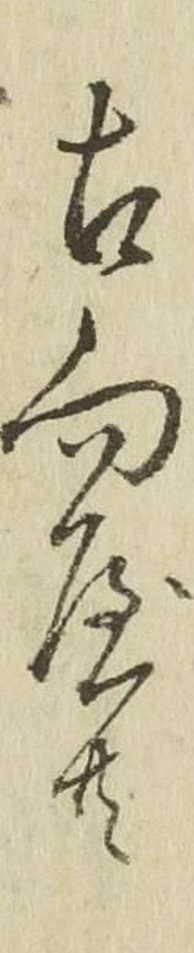古向屋共
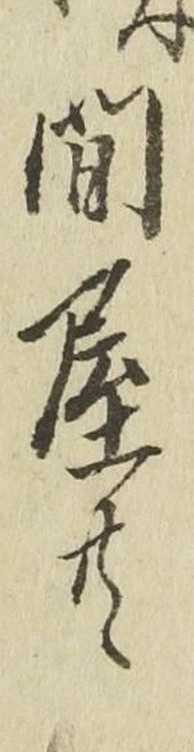問屋共
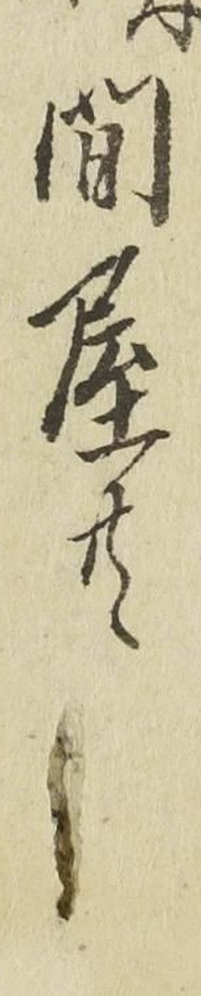問屋共
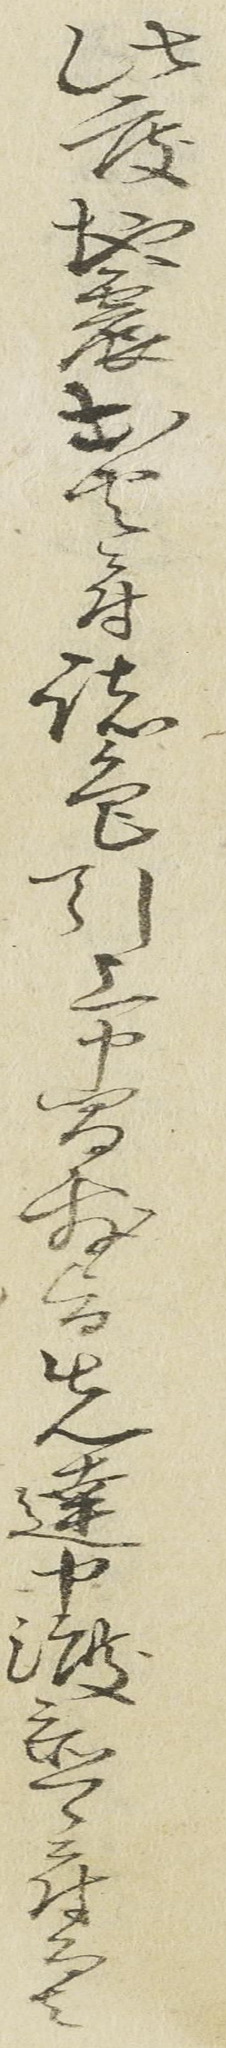此度地震出火二諸色引上申間敷旨先達申渡置候に付而は
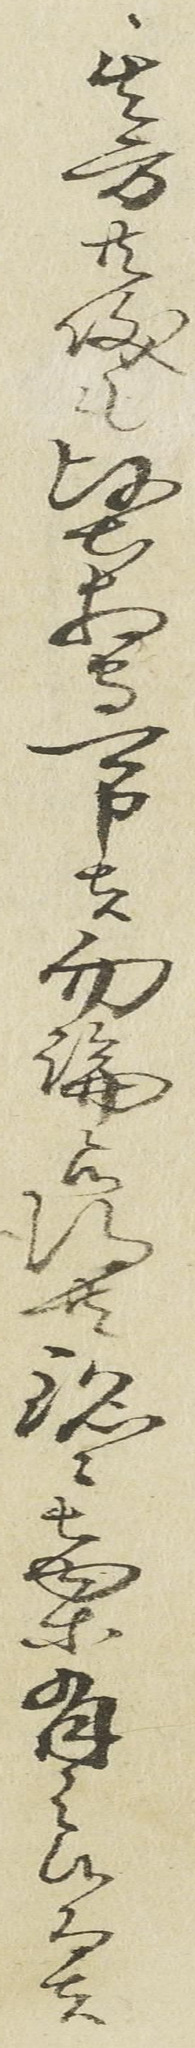其方共儀も堅相守可申は勿論二候得共銘々商等有之候而は
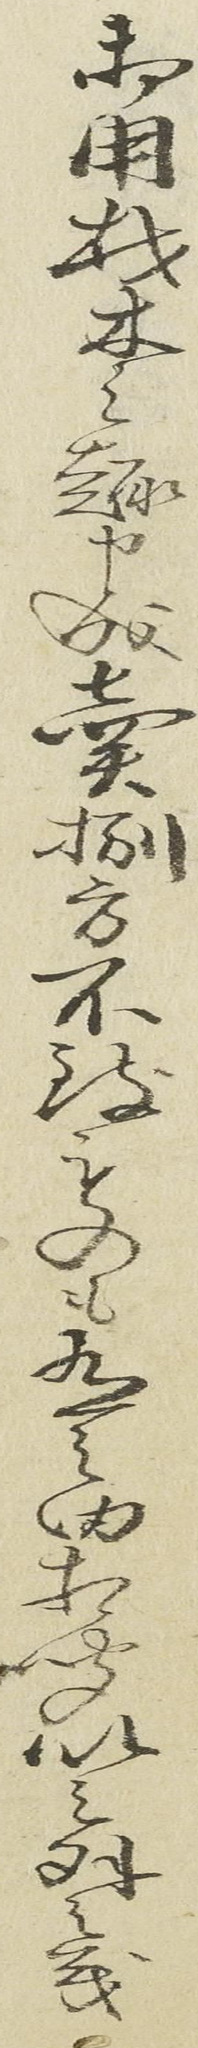御用材木之趣申成売捌方不致ものも有之由相聞以之外之義
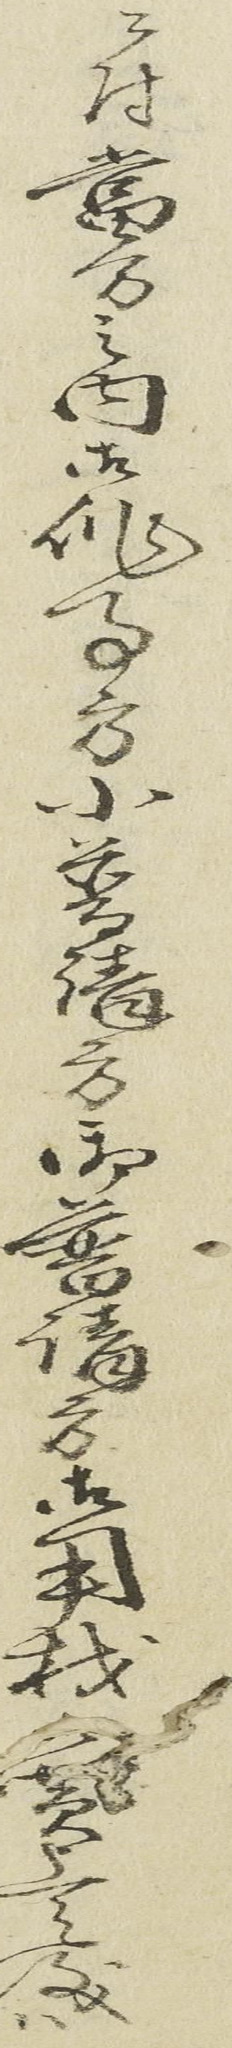二付当方之内御作事方小普請方御普請方御用材御買上之儀ハ
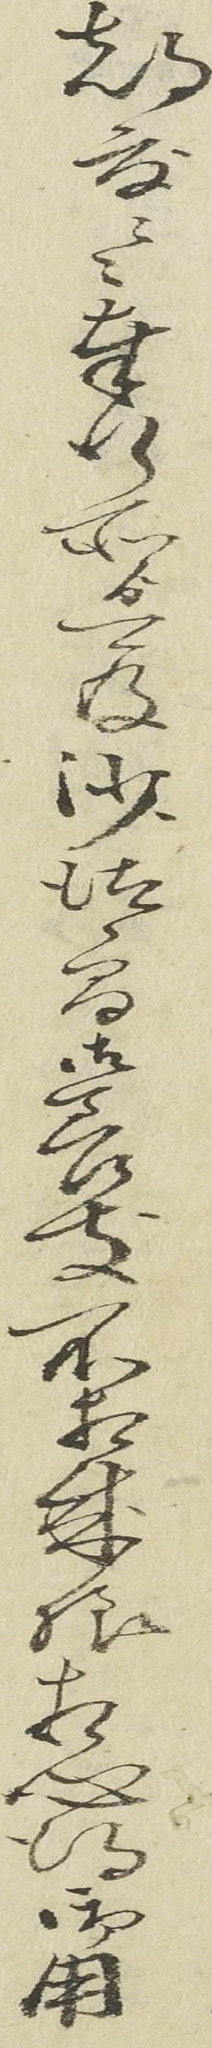都度々々二奉行所ゟ可及沙汰候間御差支不相成様相心得御用

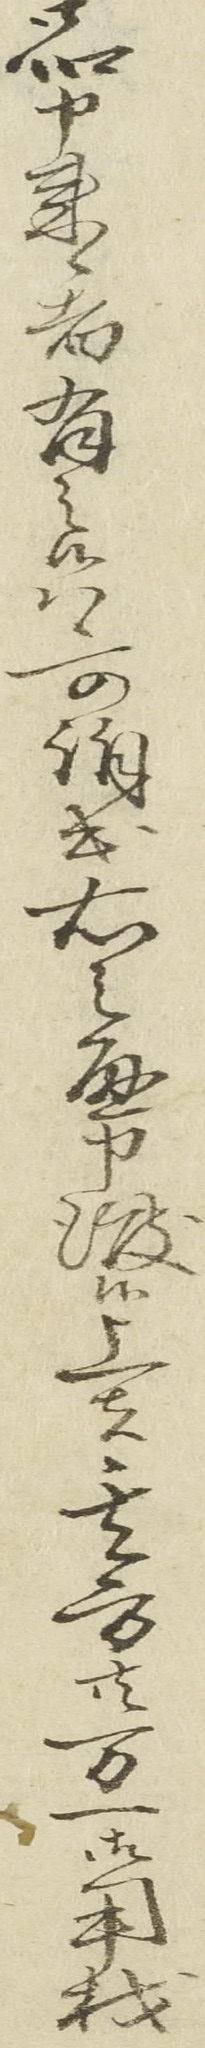品申来候者有之候ハゝ可訴出右之通申渡候上は其方共万一御用材
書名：安政二乙卯年十月二日大地震之事
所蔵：東京大学地震研究所図書室 Earthquake Research Institute Library, The University of Tokyo, JAPAN
